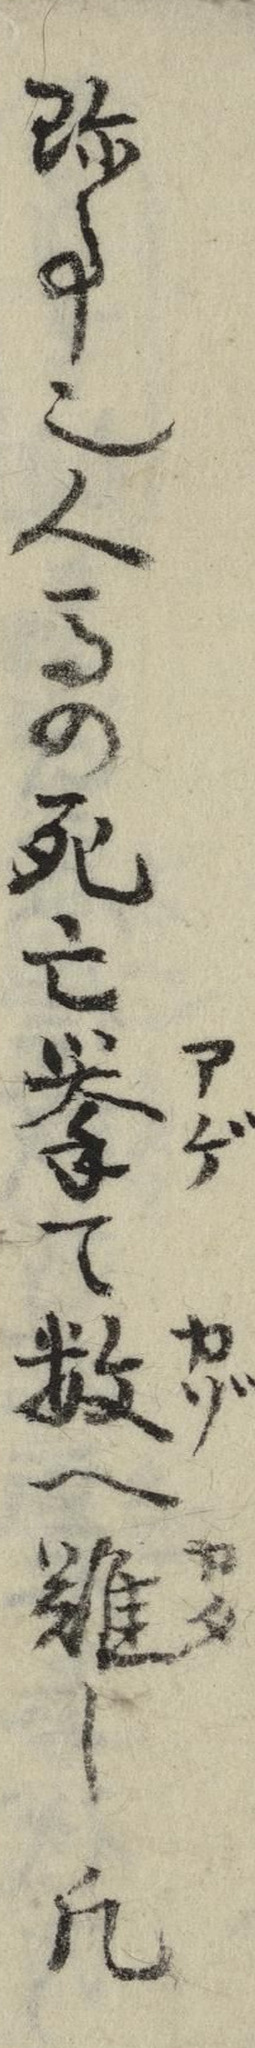珍事也人馬の死亡挙て数へ難し凡
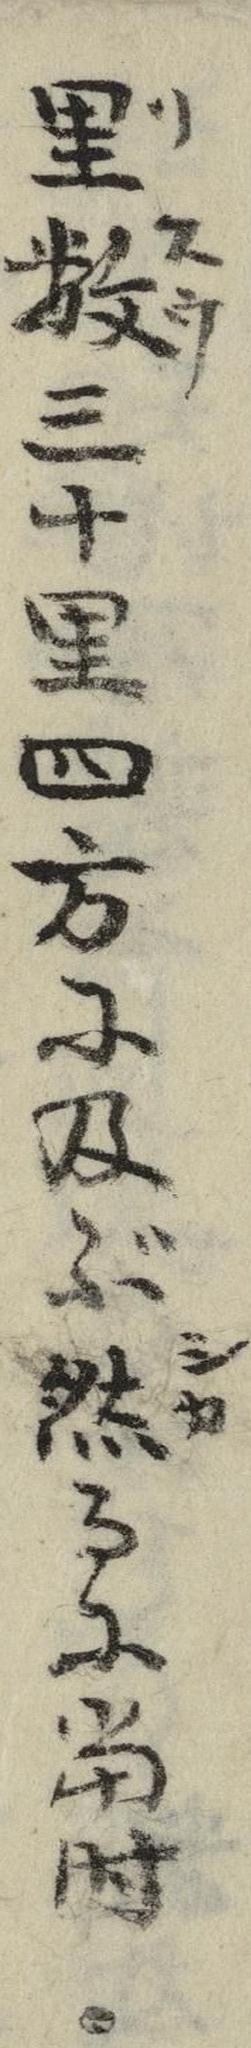里数三十里四方に及ぶ然るに当時
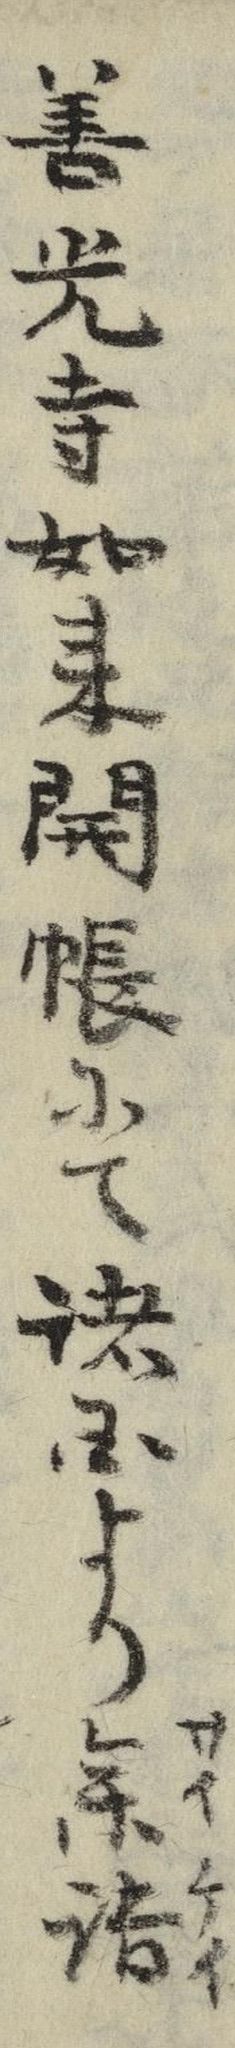善光寺如来開帳にて諸国より参詣
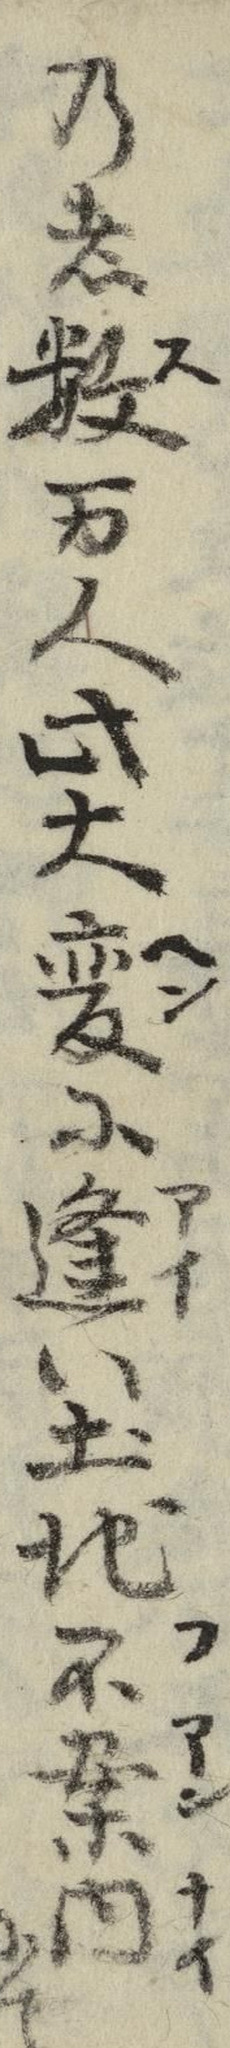乃者数万人此大変に逢い土地不案内にて
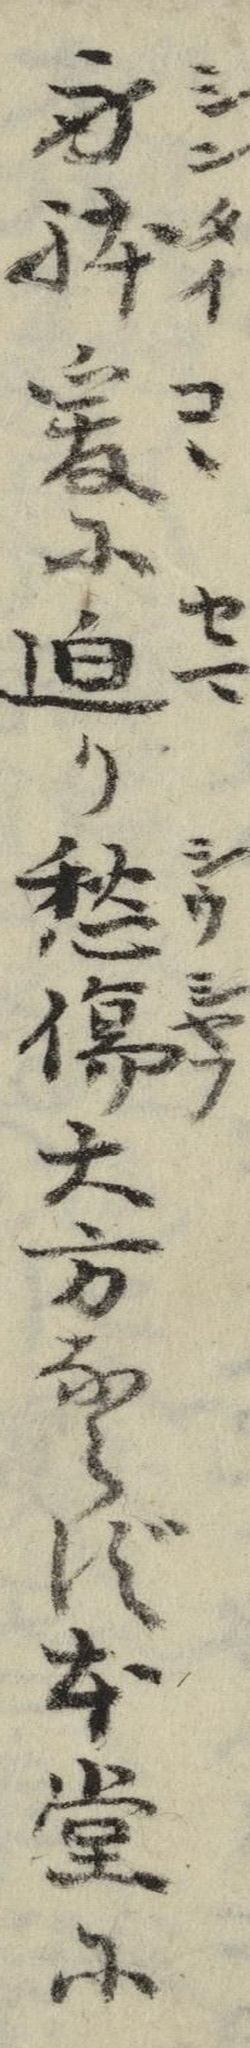身体爰に迫り愁傷大方ならず本堂に
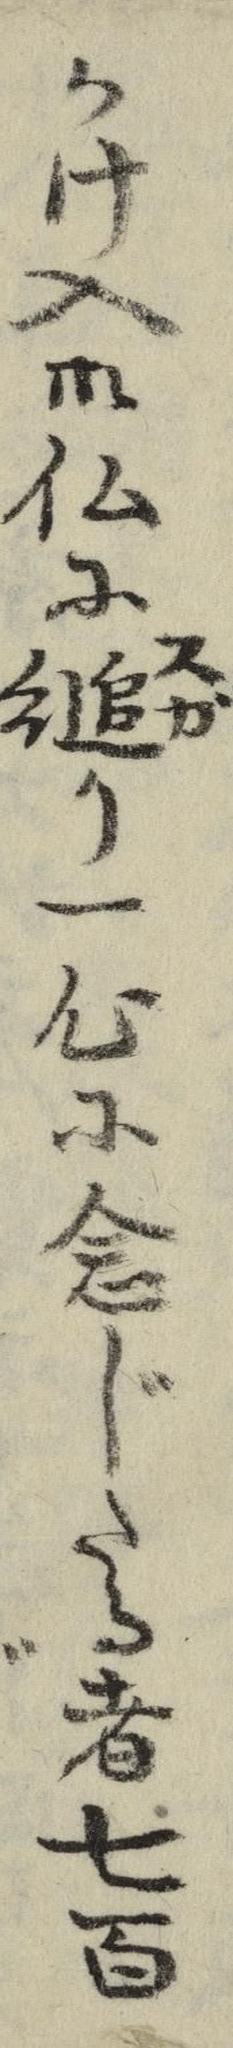かけ入御仏に縋り一心に念じたる者七百
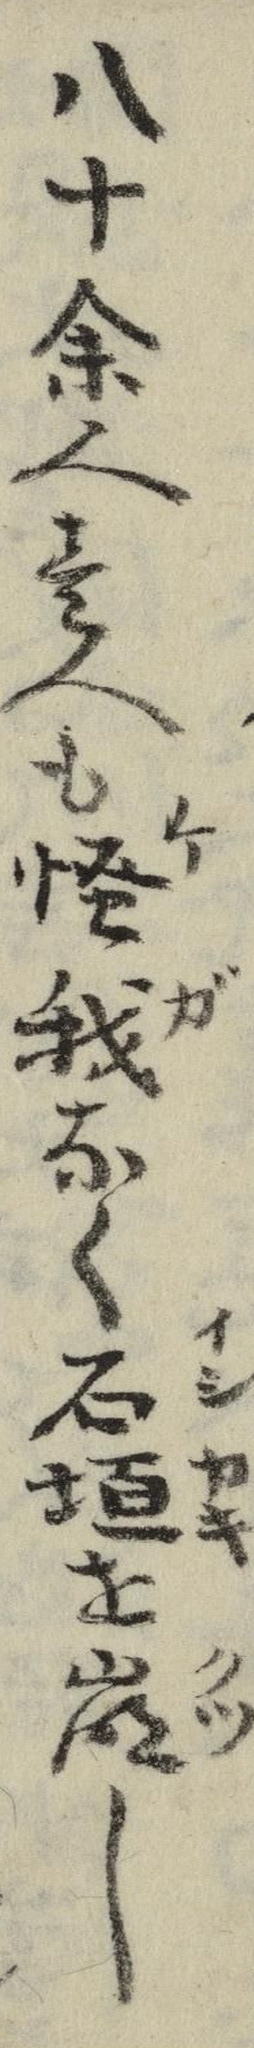八十余人壱人も怪我なく石垣を崩し
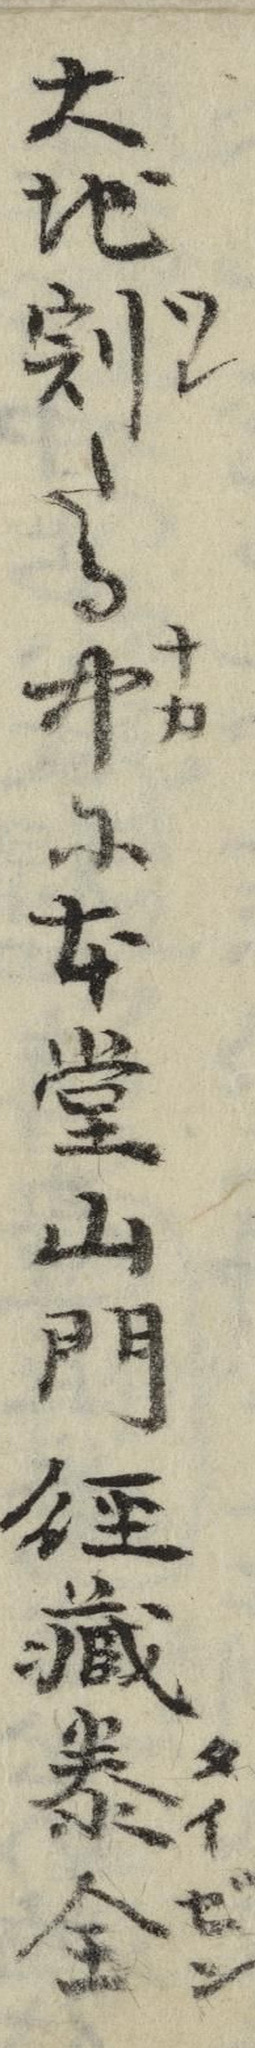大地割たる中に本堂山門経蔵泰全
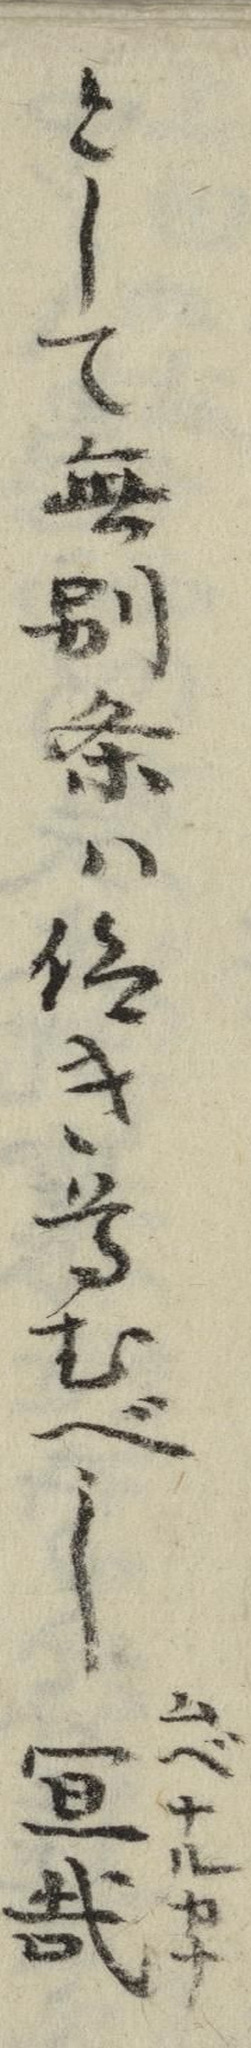として無別条ハ仰き尊むべし宣哉
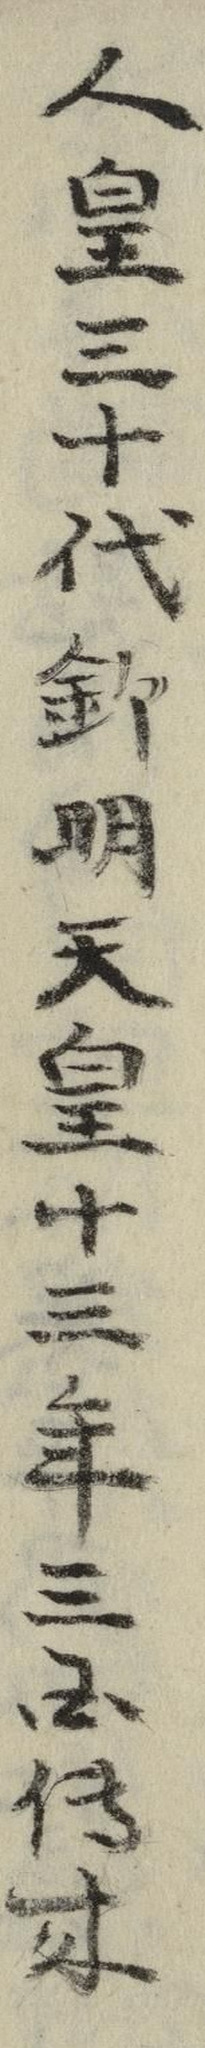人皇三十代欽明天皇十三年三国伝来
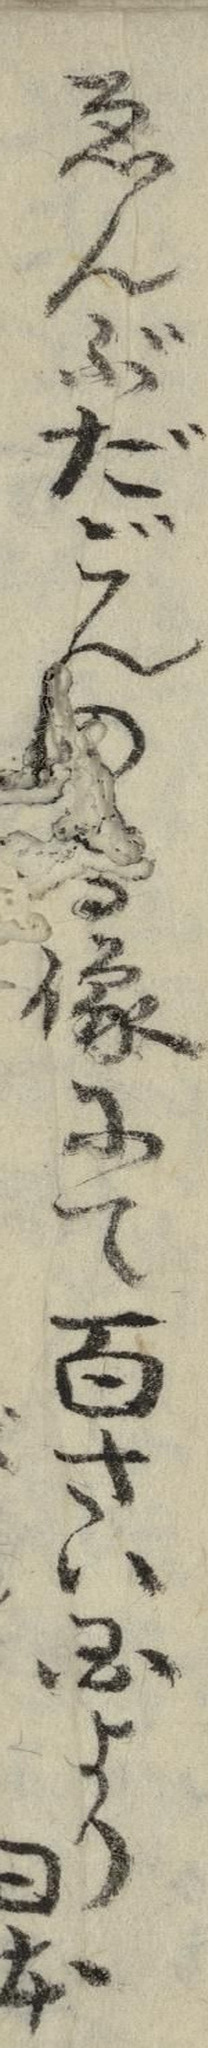ゑんぶだごんの尊像にて百さい国より日本
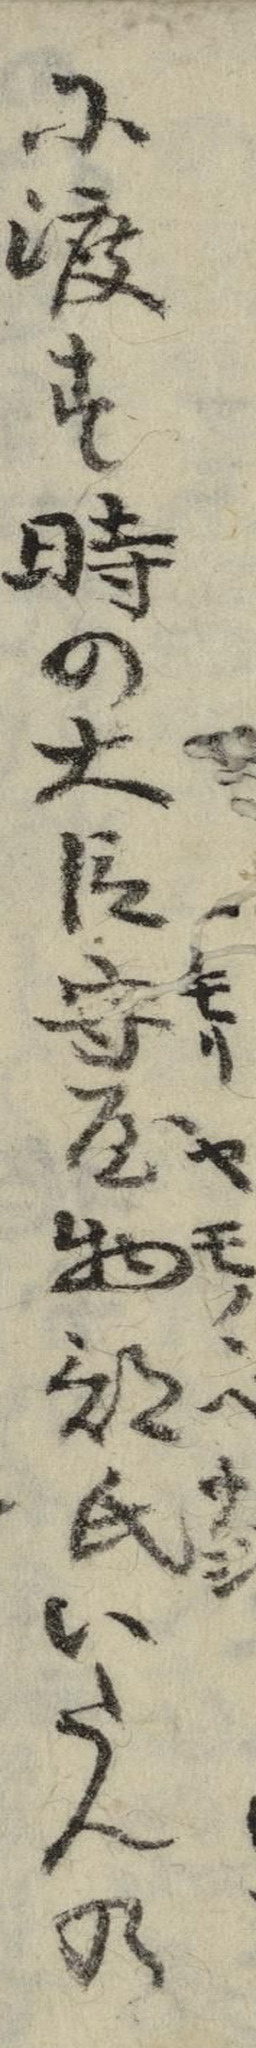に渡す時の大臣守屋物部氏いたん乃
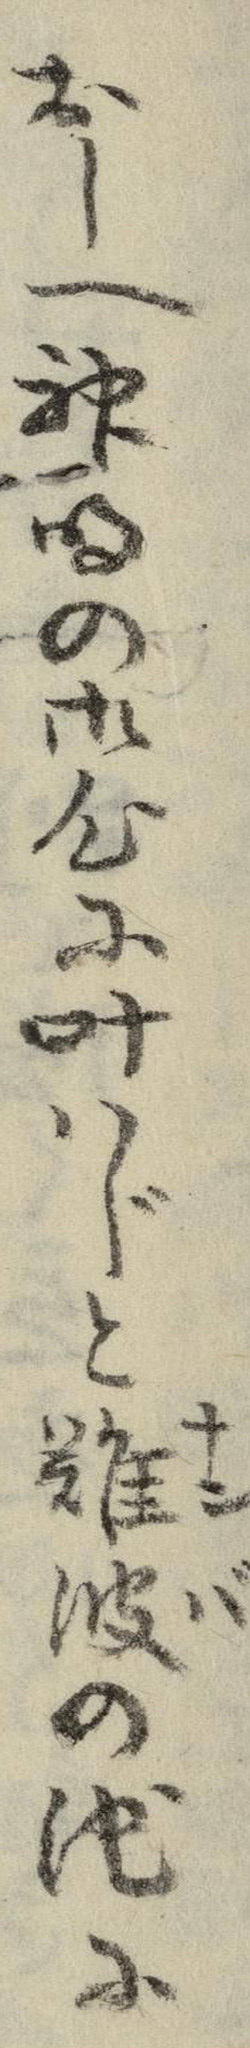おしへ神明の御心不叶ハじと難波の池に
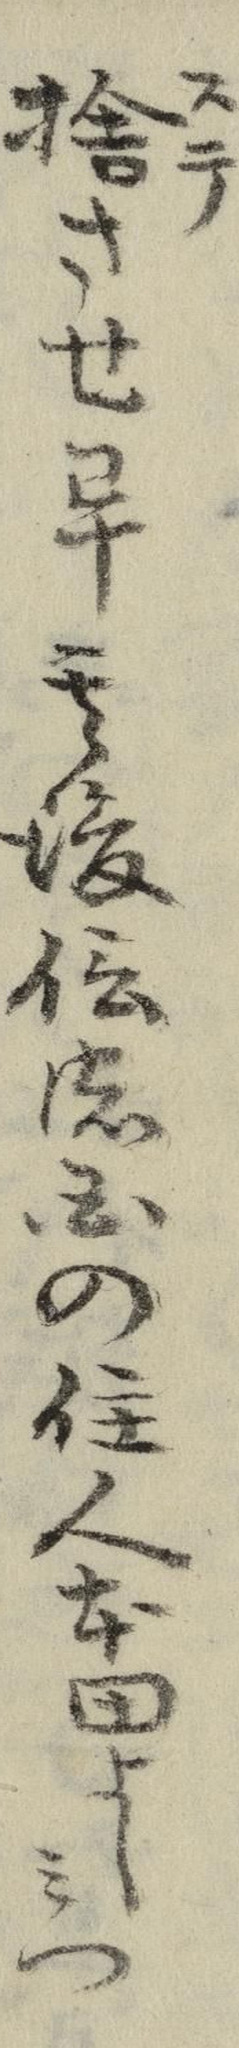捨させ畢其後信濃国の住人本田よしミつ
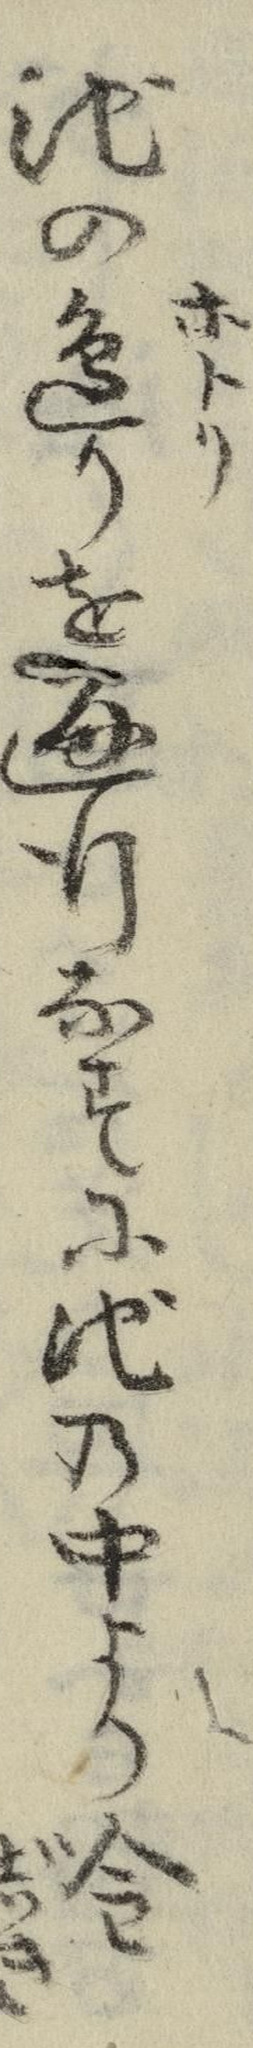池の辺を通行なすに池乃中により金じき
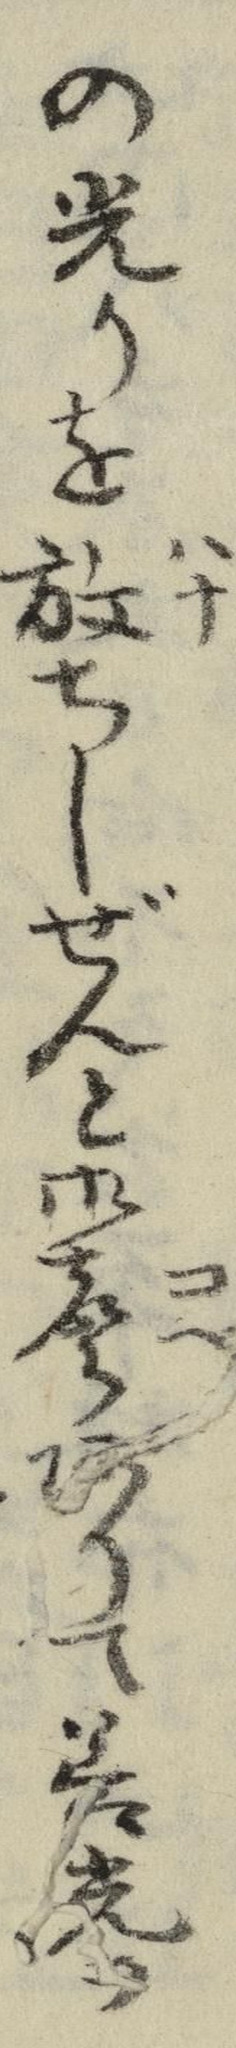の光りを放ちしぜんと御声ありて善光ヲ
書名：信州大地震一件之冩　丁未弘化四年三月吉日
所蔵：東京大学地震研究所図書室 Earthquake Research Institute Library, The University of Tokyo, JAPAN
